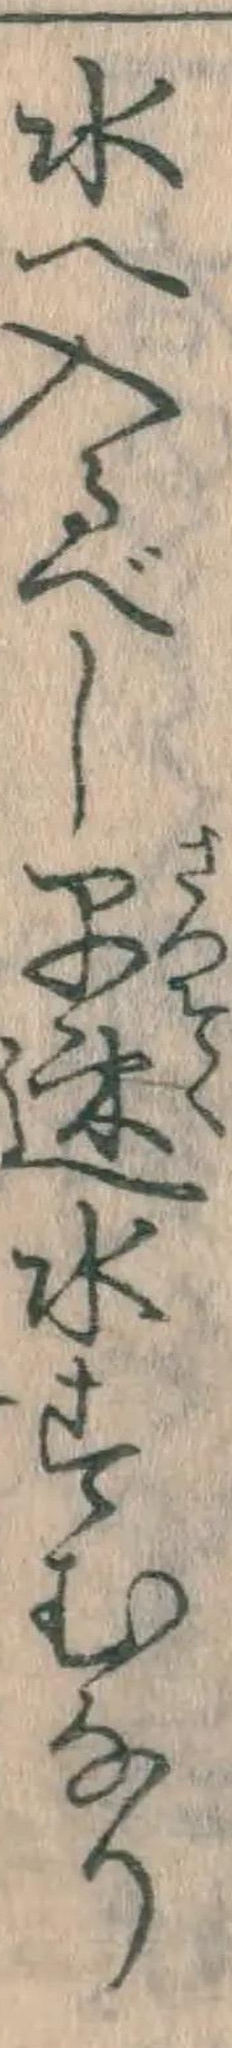水へ入るべし早速水すむなり
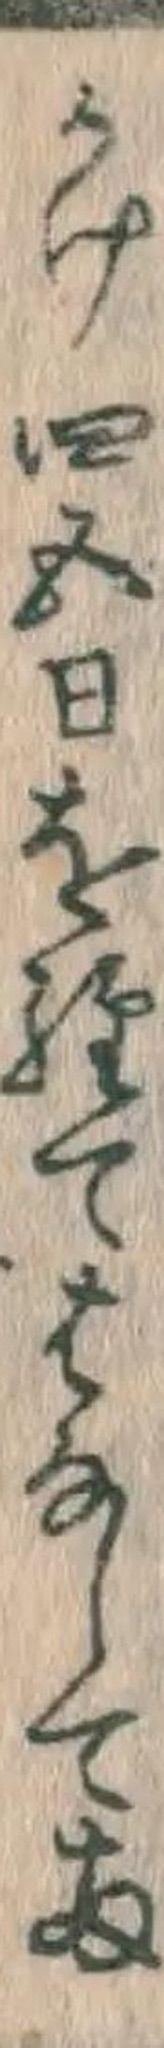かけ四五日を経てはなして両
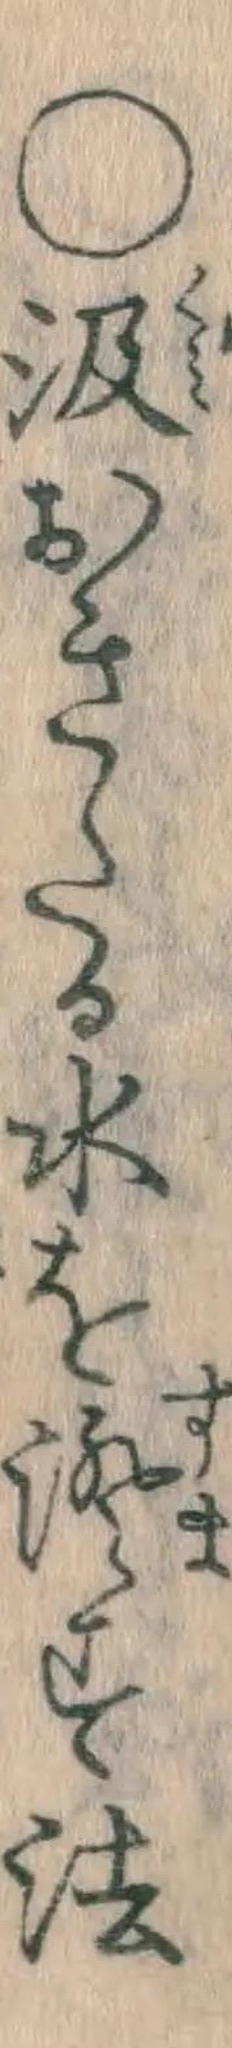○汲おきたる水を澄す法
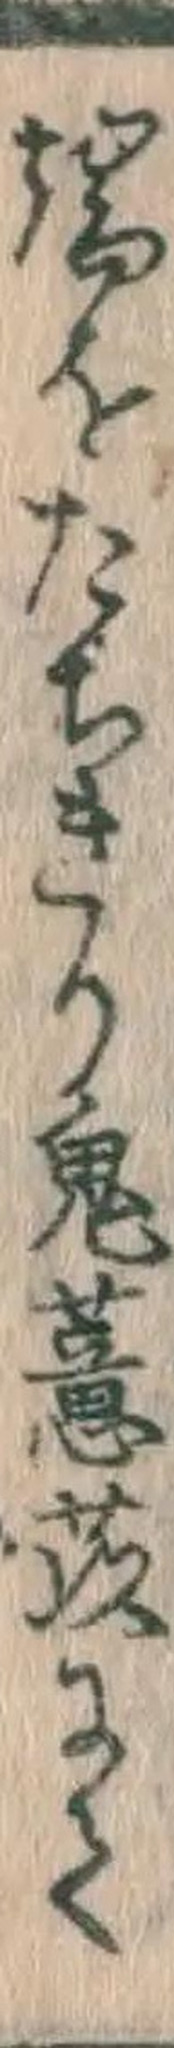端をたちきり鬼薏苡にて
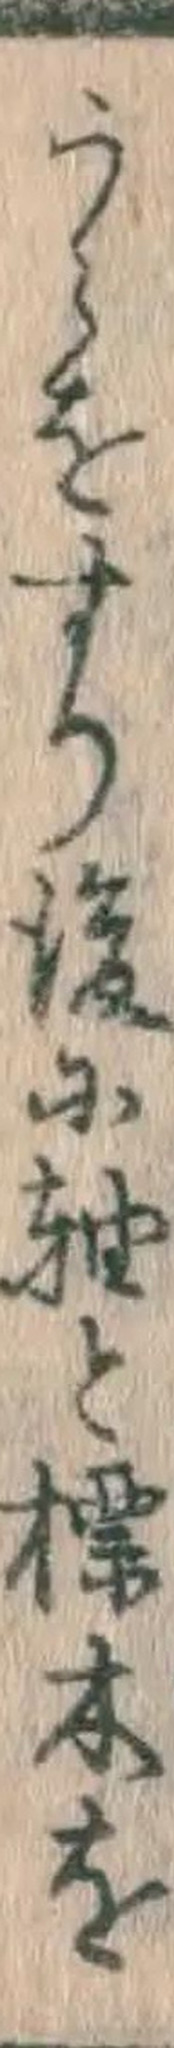うらをすり後に軸と標木を
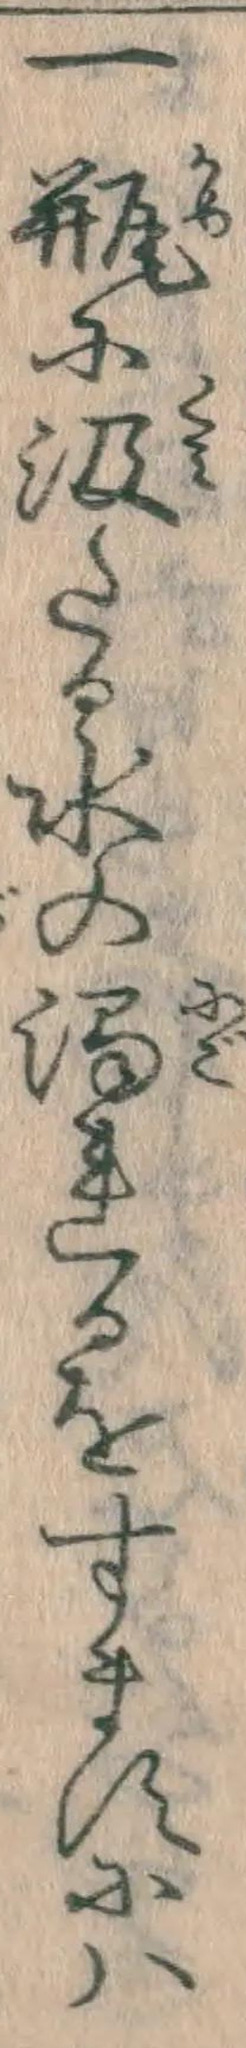一瓶に汲たる水の濁れるをすますには
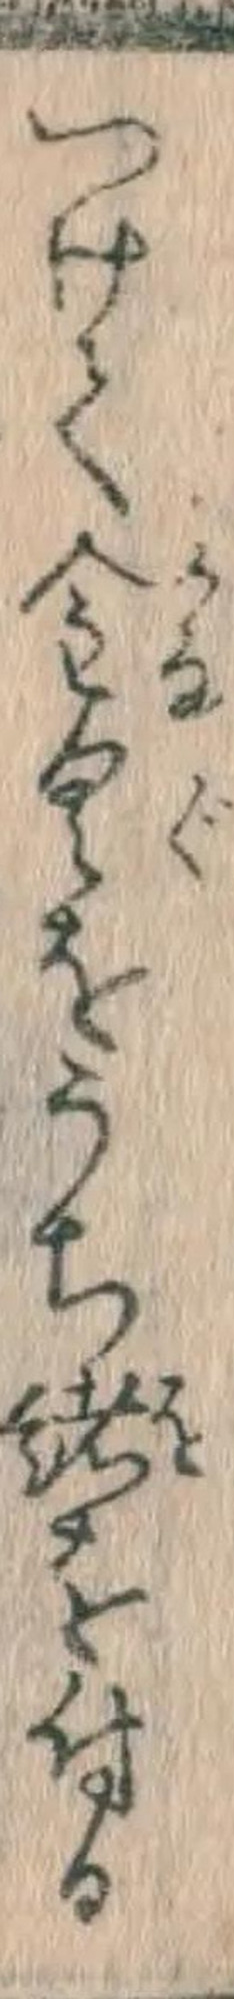つけて金具をうち緒を付る
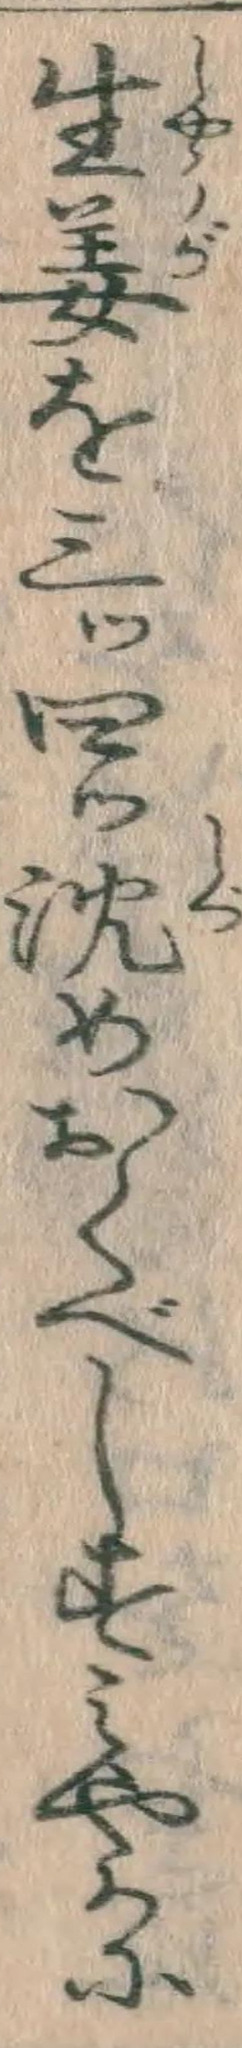生姜を三ッ四ッ沈めおくべしすみやかに
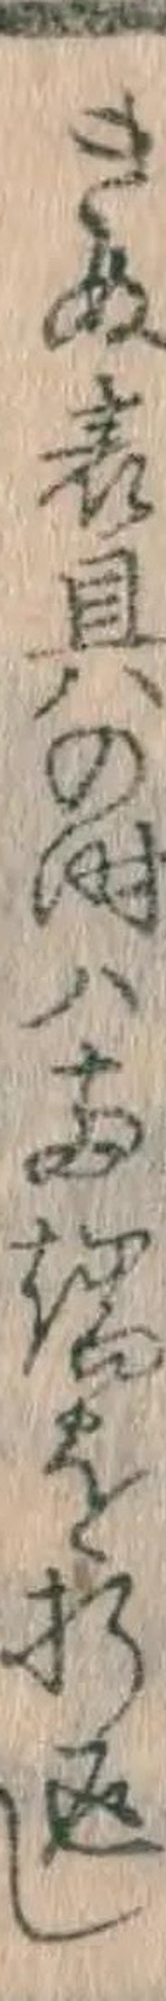きぬ表具の時は両端を折返し
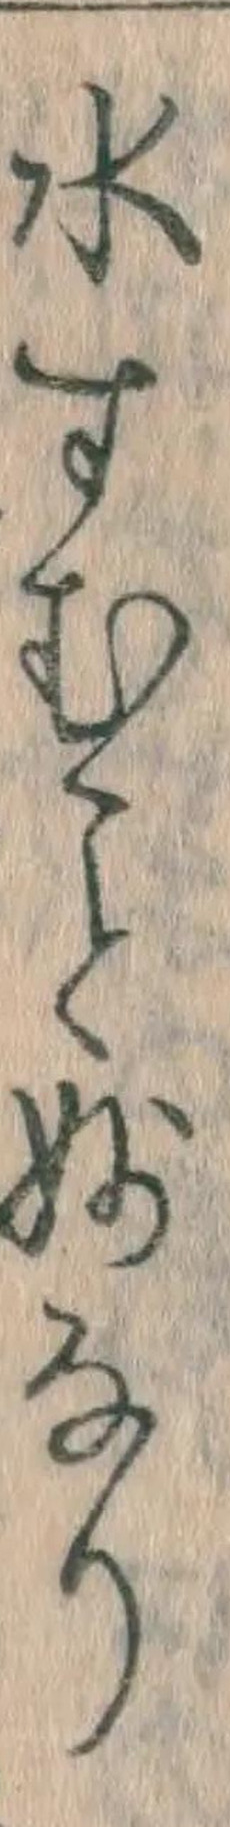水すむこと妙なり
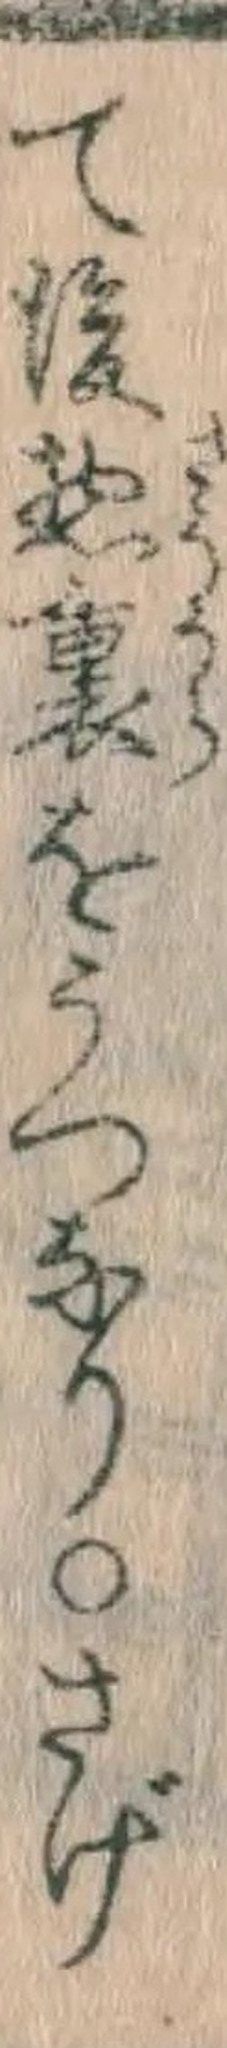て後惣裏をうつなり◦さげ
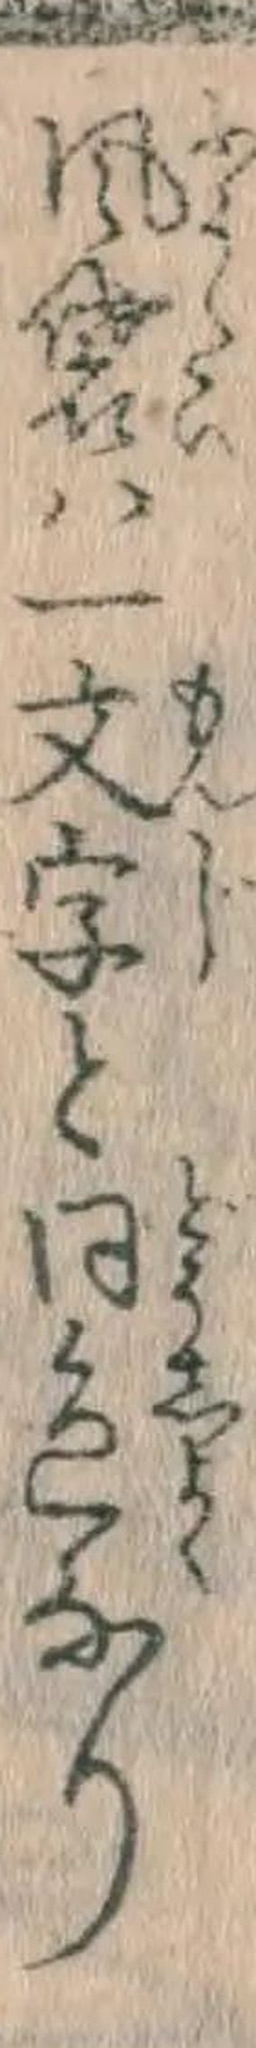風袋は一文字と同色なり
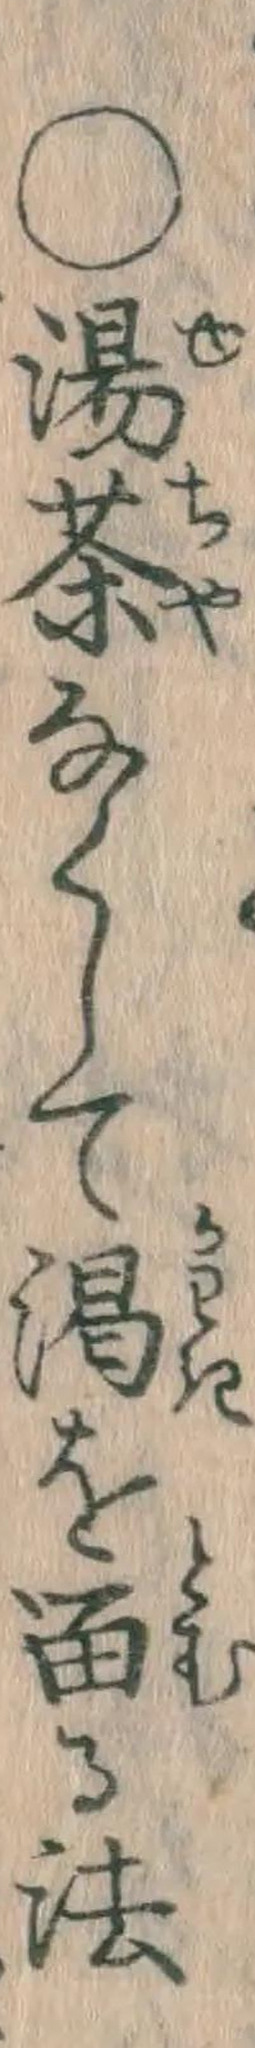○湯茶なくして渇を留る法
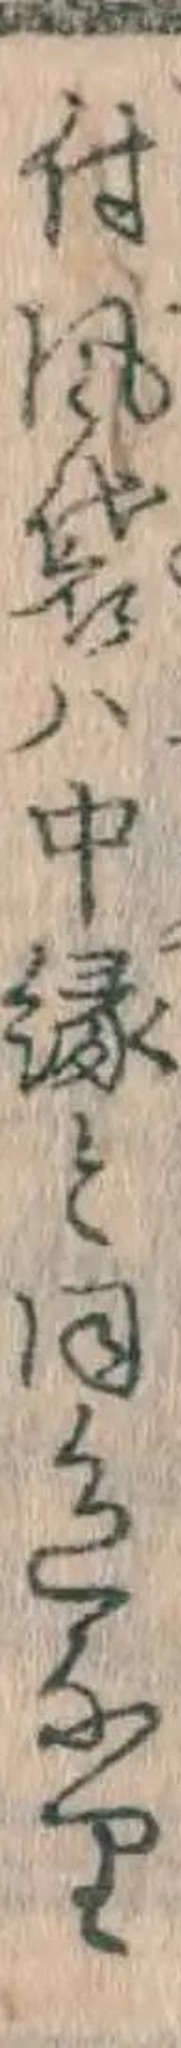付風袋は中縁と同色なり
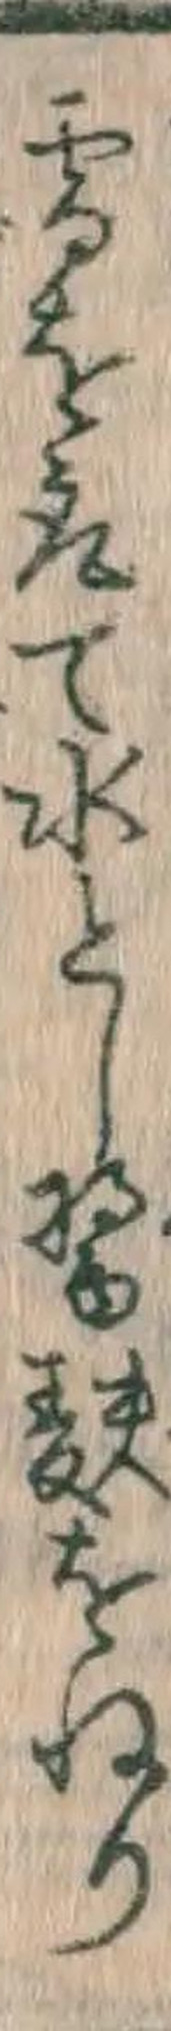雪を取て水とし醤麩をねり
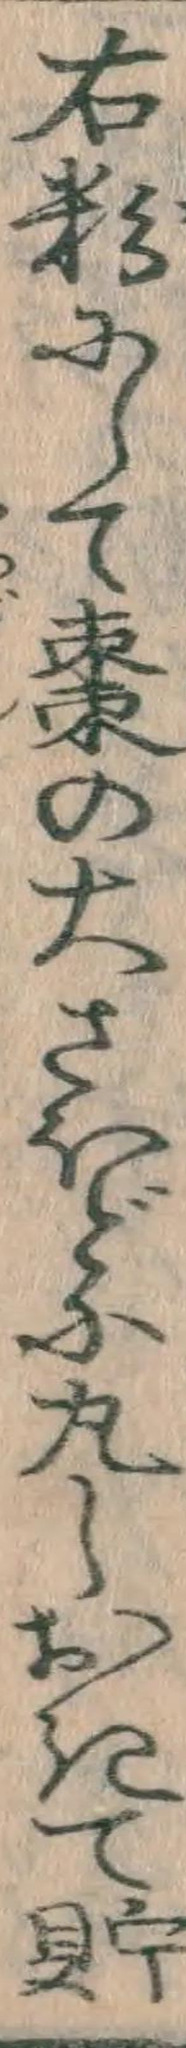右粉にして棗の大さほどに丸しおきて貯
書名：広益秘事大全 3巻. [2]
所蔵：国立国会図書館 National Diet Library, JAPAN
